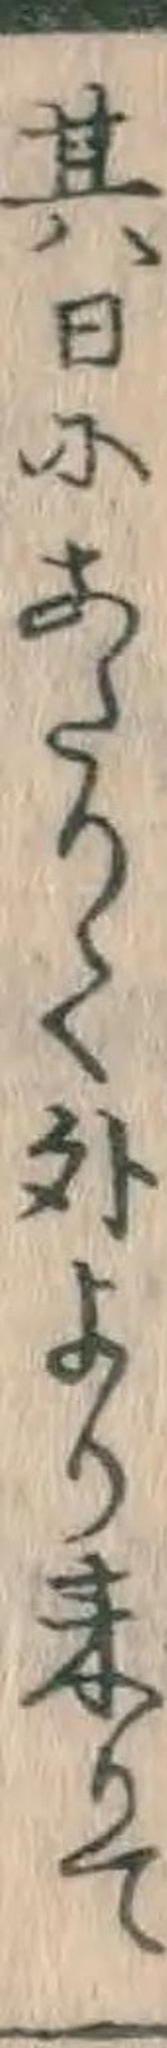其日にあたりて外より来りて
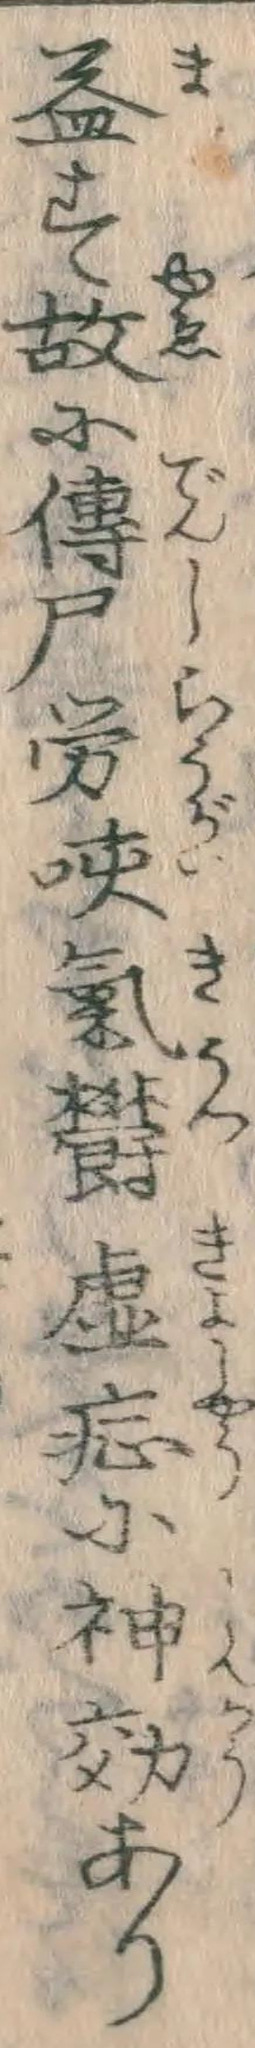益す故に伝尸労咳気鬱虚症に神効あり
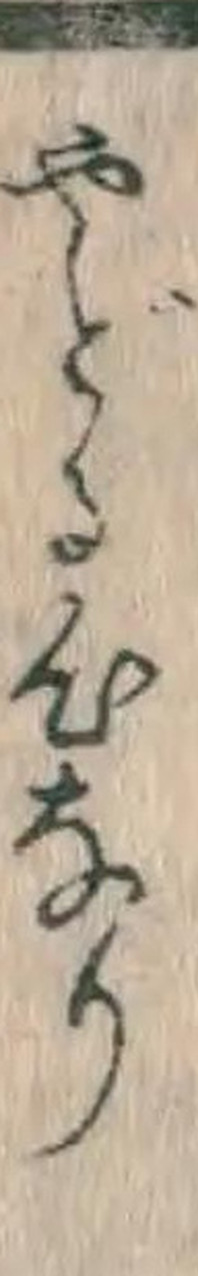やどる心なり
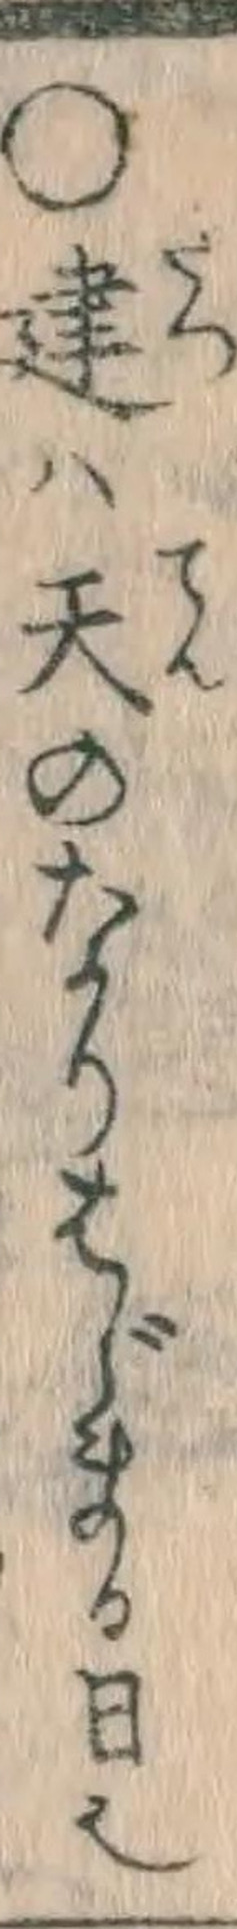○建は天のなりはじまる日也
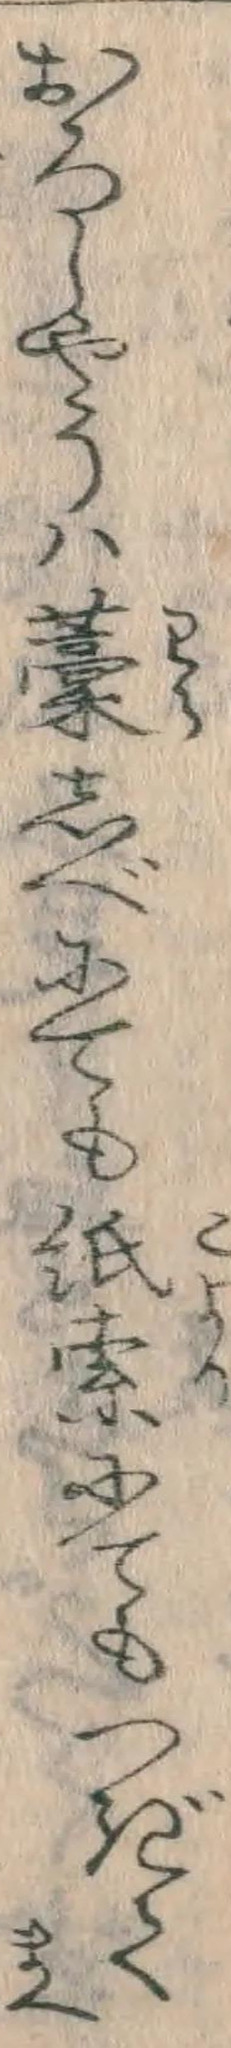おろしやうは藁しべにても紙索にてもつぎて
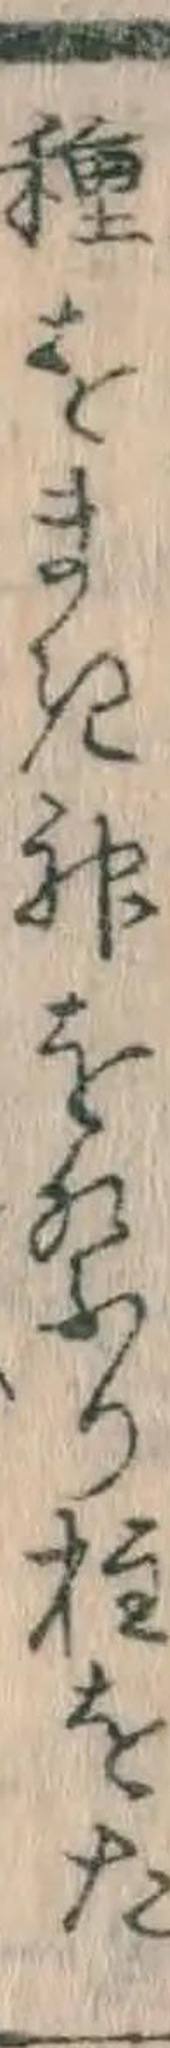種をまき神を祭り柱をた
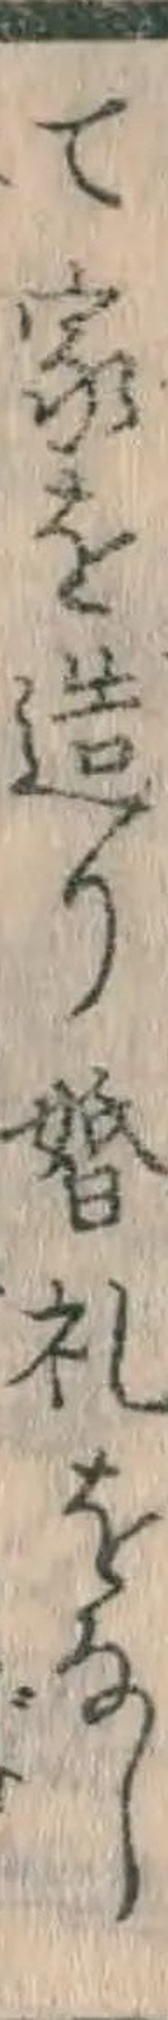て家を造り婚礼をなし
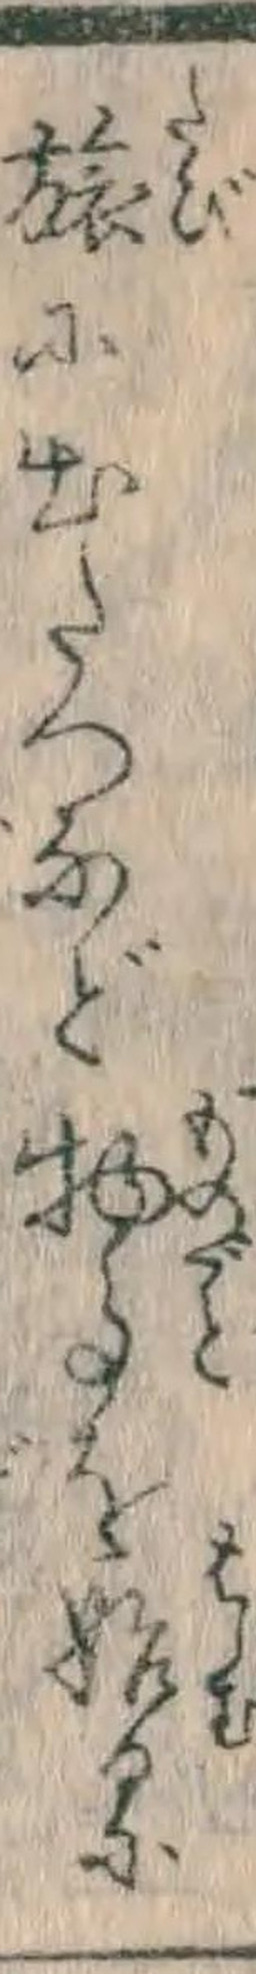旅に出たつなど物事を始るに
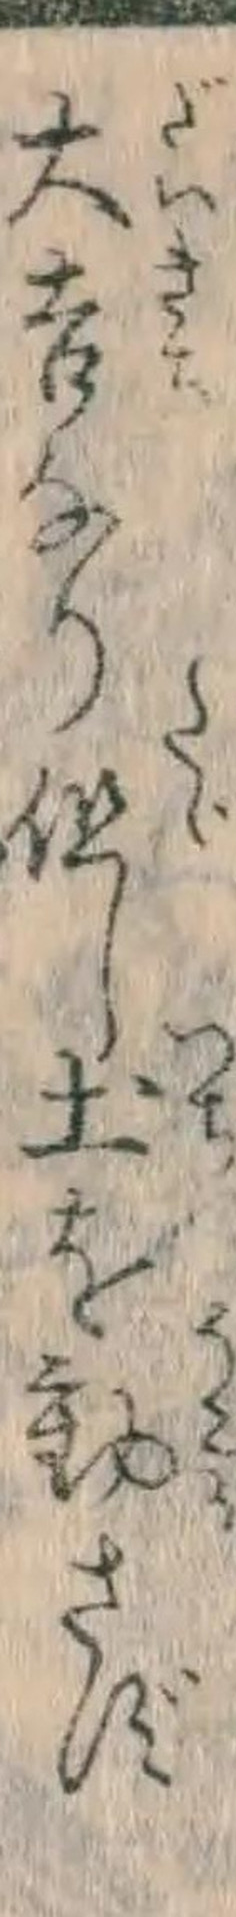大吉なり但し土を動さず
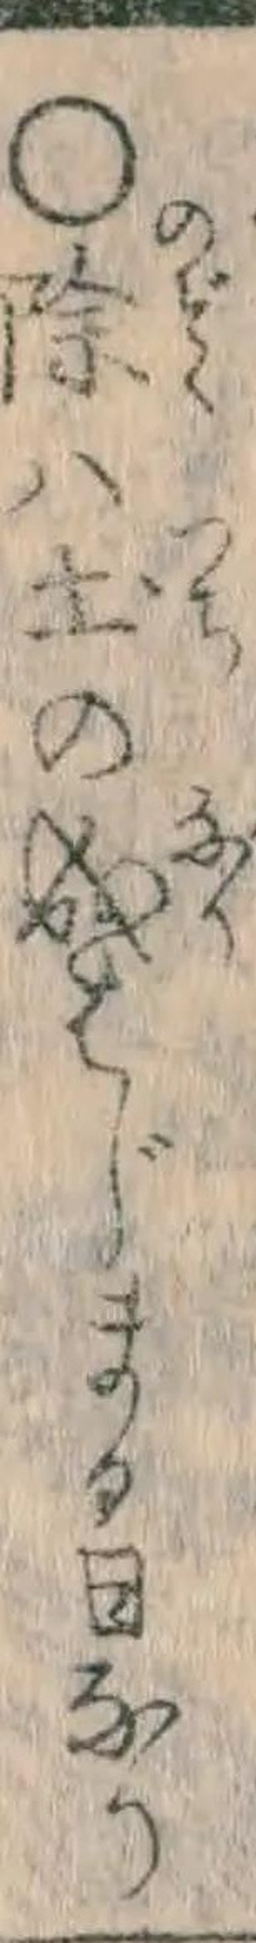○除は土の成はじまる日なり
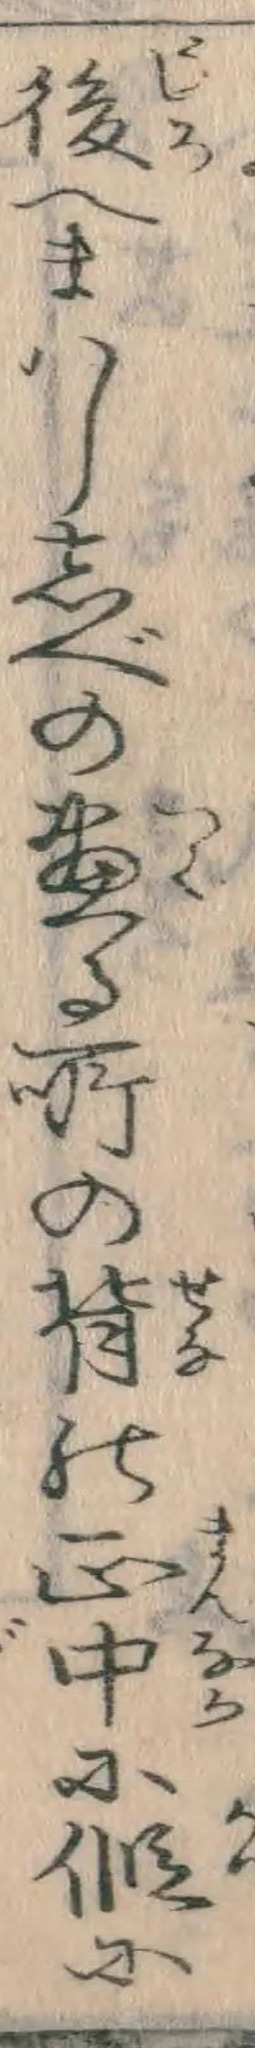後へまはししべの尽る所の背の正中に仮に
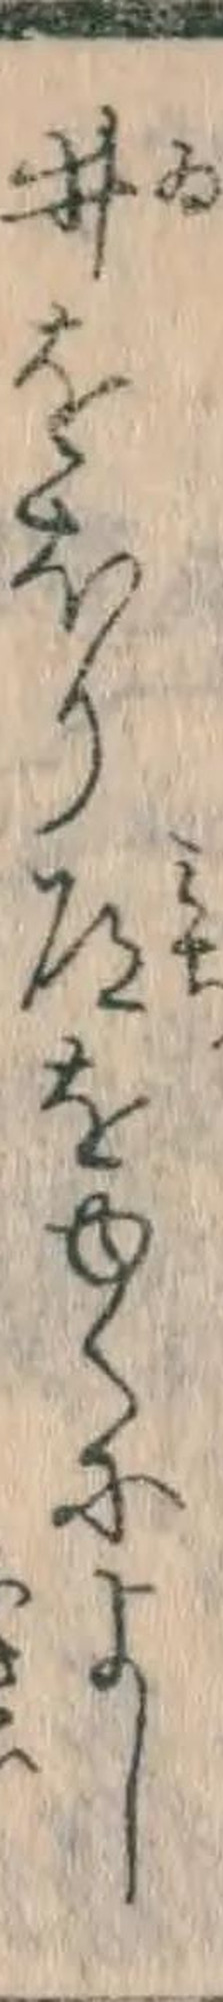井をほり道をゆくによし
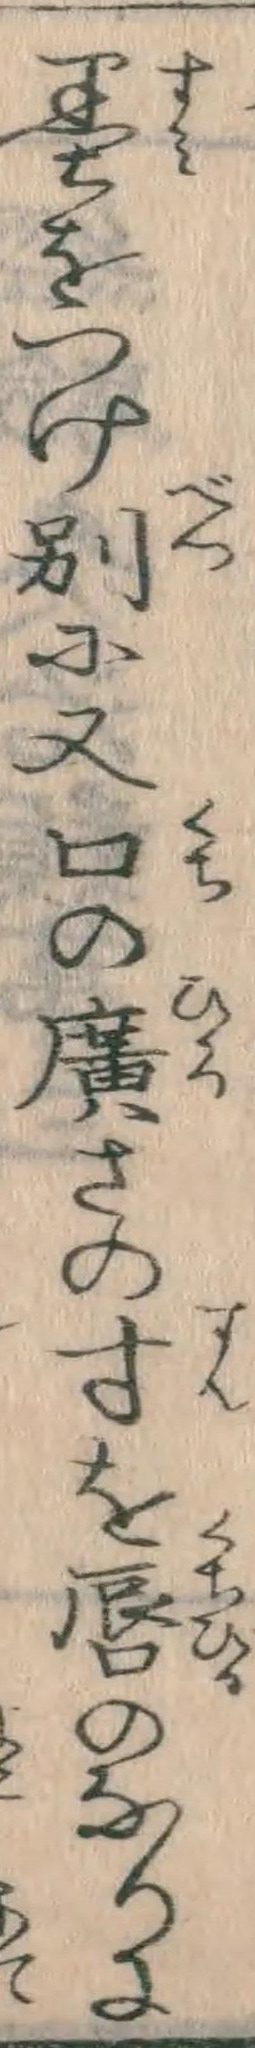墨をつけ別に又口の広さの寸を唇のなりに
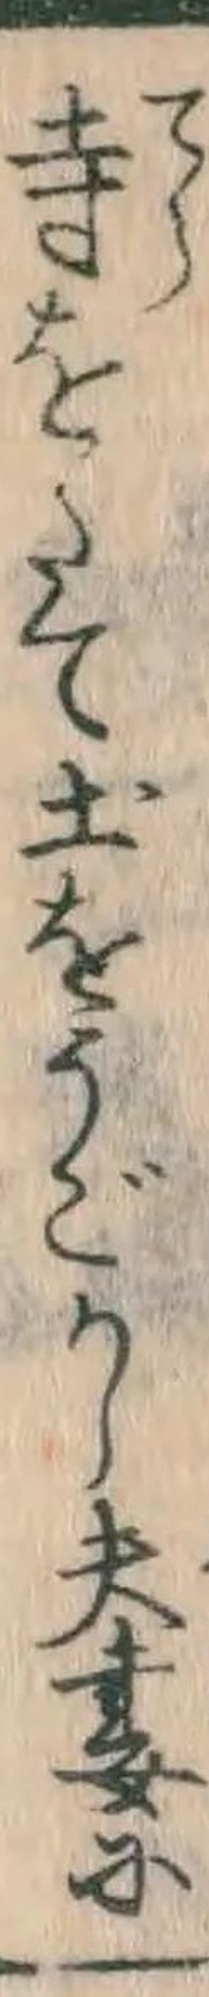寺をたて土をうごかし夫妻に
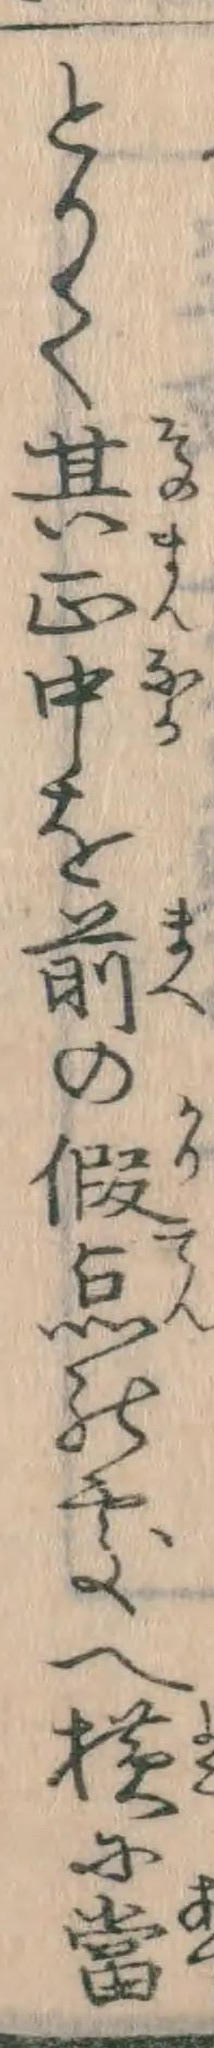とりて其正中を前の仮点の処へ横に当
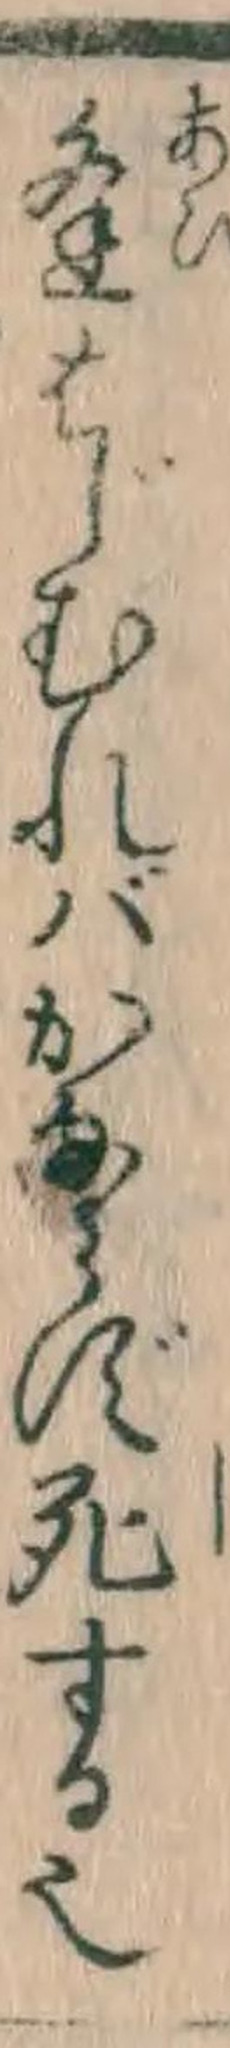逢はじむればかならず死する也
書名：広益秘事大全 3巻. [4]
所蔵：国立国会図書館 National Diet Library, JAPAN
